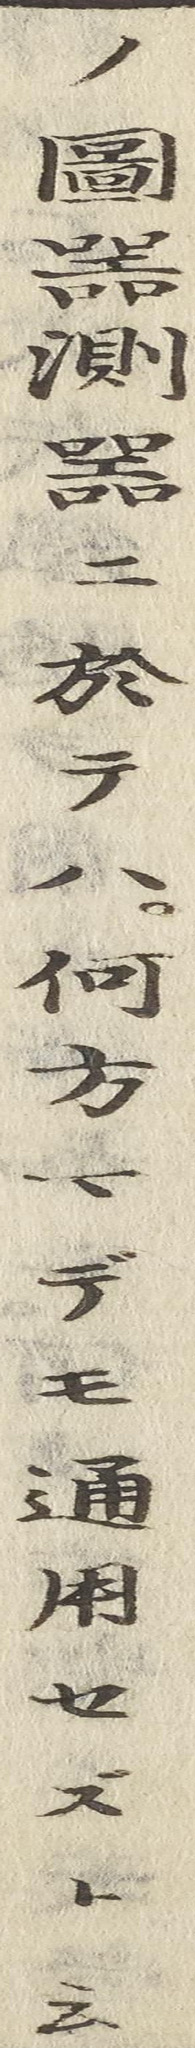ノ図器測器ニ於テハ。何方マデモ通用セズト云
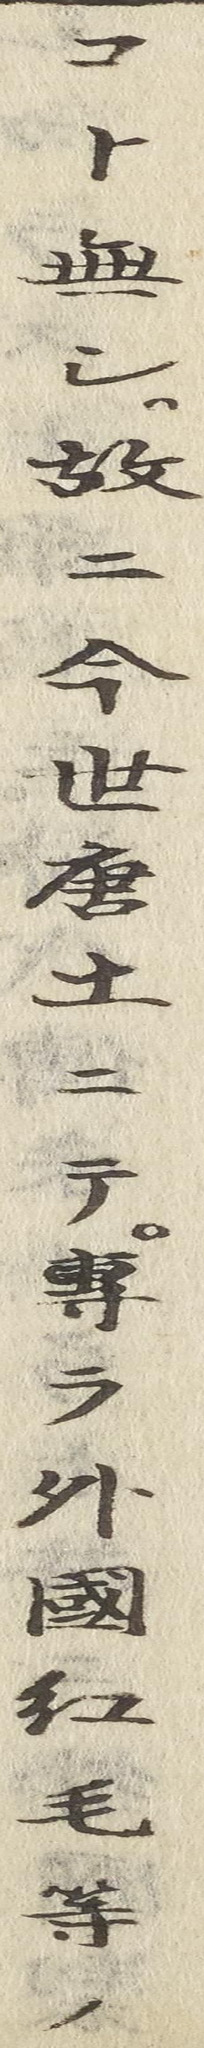コト無シ。故ニ今世唐土ニテ。専ラ外国紅毛等ノ
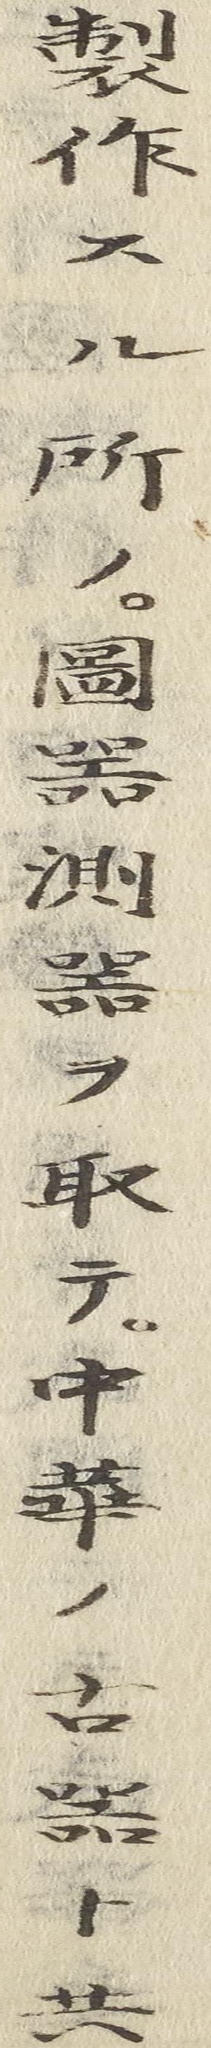製作スル所ノ。図器測器ヲ取テ。中華ノ古器ト共
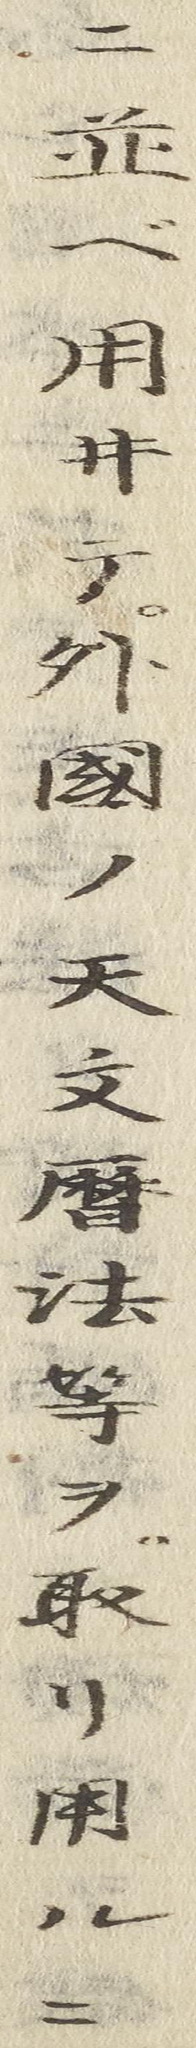ニ並ベ用ヰテ。外国ノ天文暦法等ヲ。取リ用ルニ
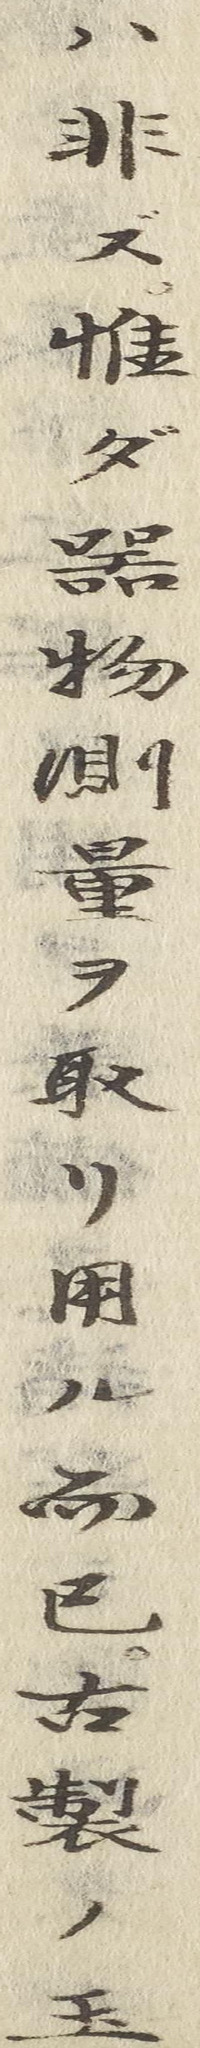ハ非ズ。唯ダ器物測量ヲ取リ用ル而已。古製ノ玉
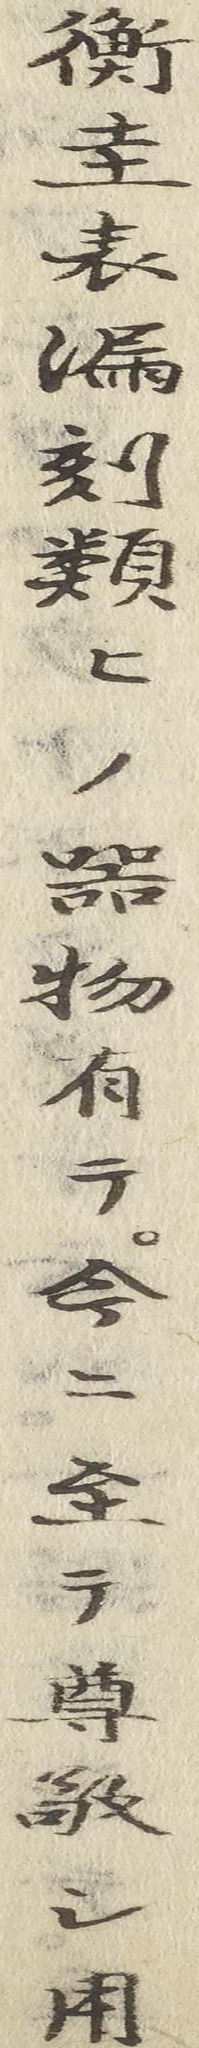衡圭表漏刻類ヒノ器物有テ。今ニ至テ尊敬シ用
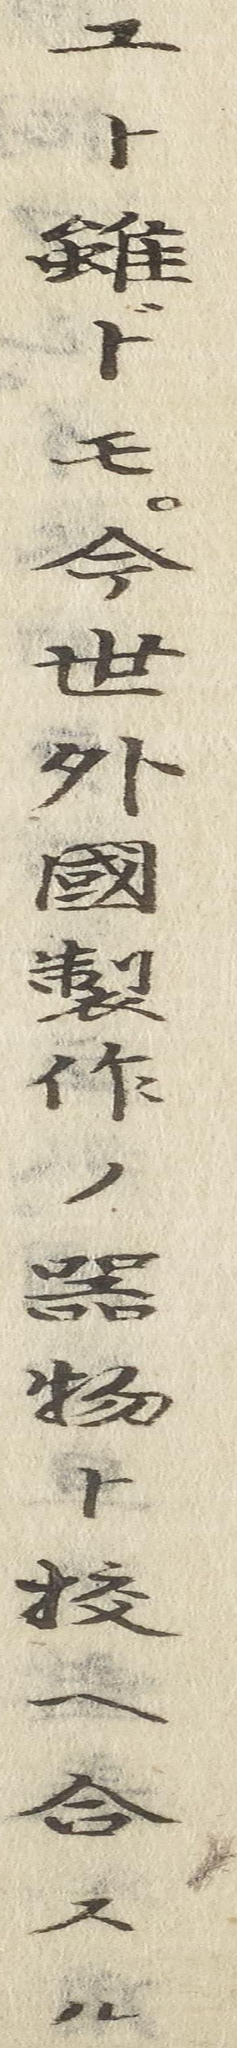ユト雖ドモ。今世外国製作ノ器物ト校ヘ合スル
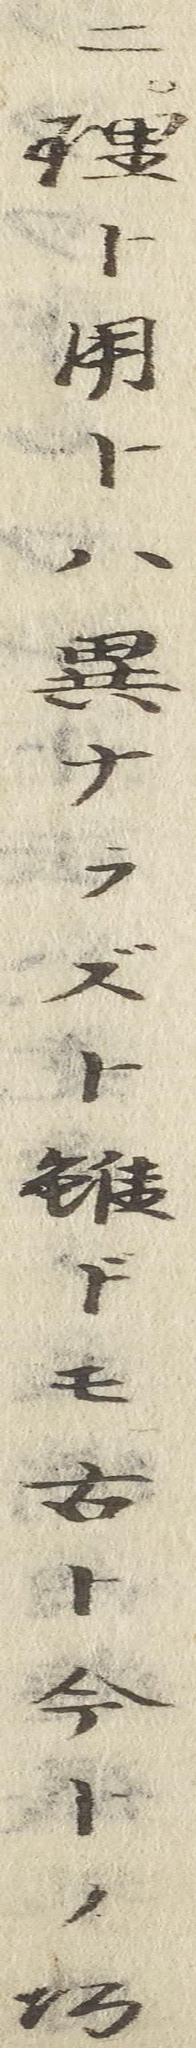ニ。理ト用トハ異ナラズト雖ドモ古ト今トノ巧
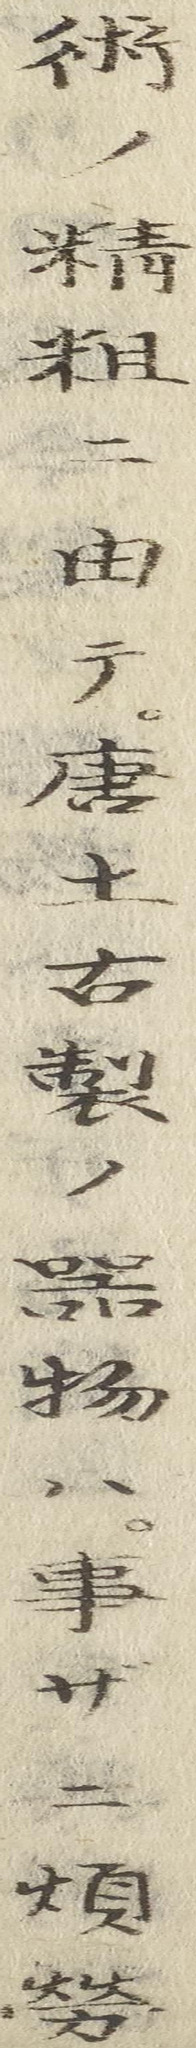術ノ精粗ニ由テ。唐土古製ノ器物ハ。事ザニ煩労

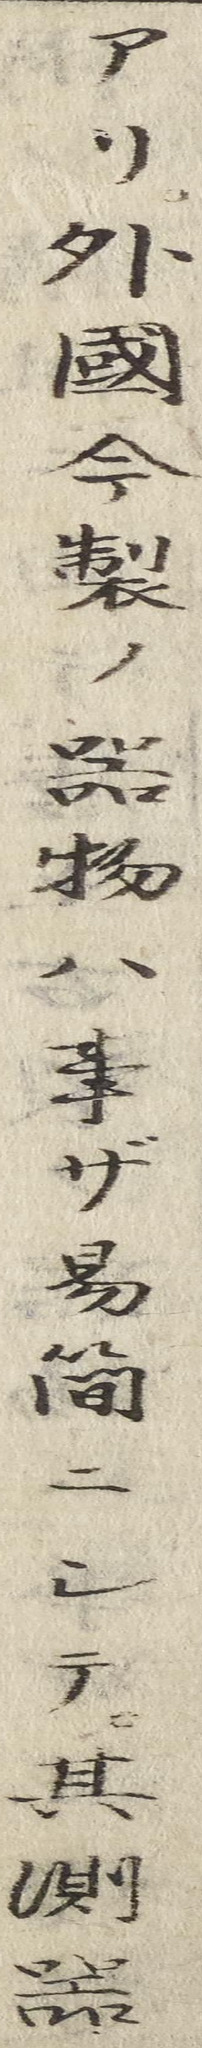アリ外国今製ノ器物ハ事ザ易簡ニシテ其測器
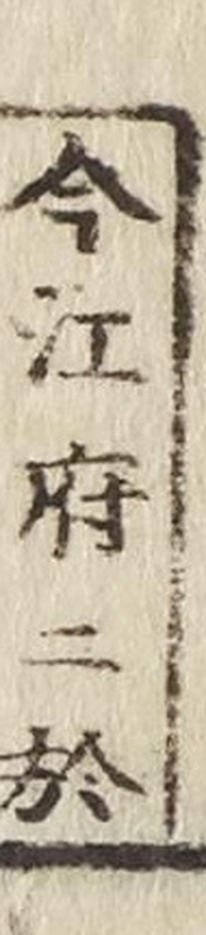今江府ニ於
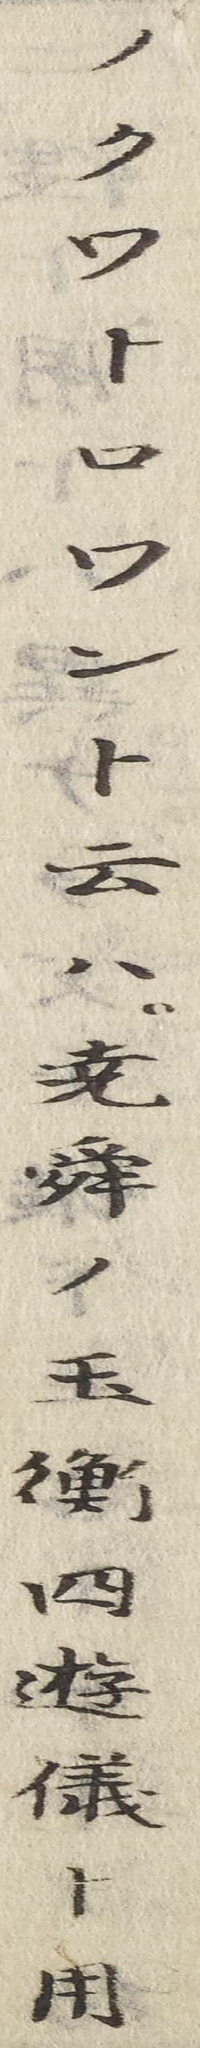ノクワトロワント云ハ。尭舜ノ玉衡四遊儀ト用
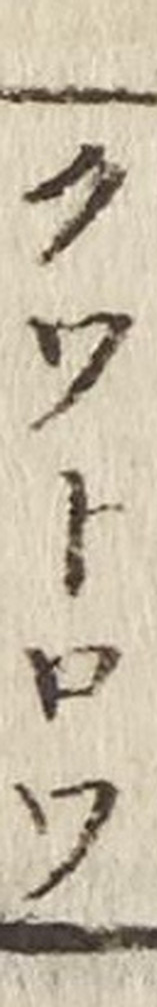クワトロワ
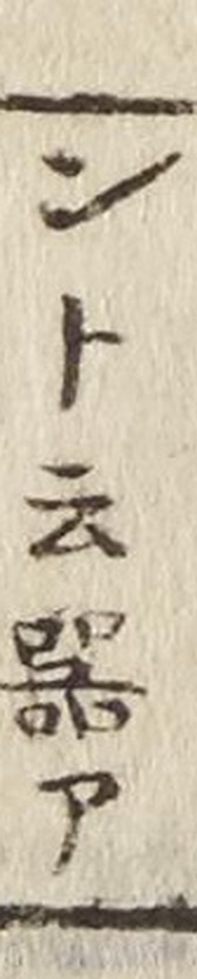ント云器ア
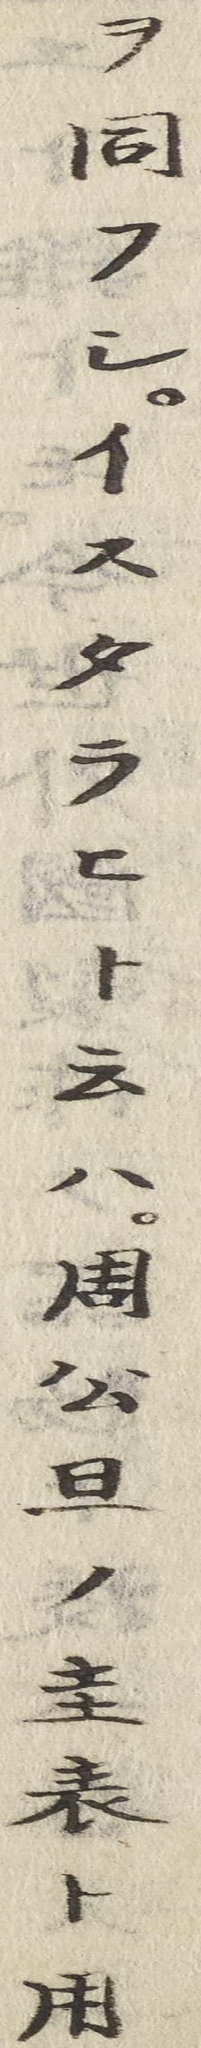ヲ同フシ。イスタラヒト云ハ。周公旦ノ圭表ト用
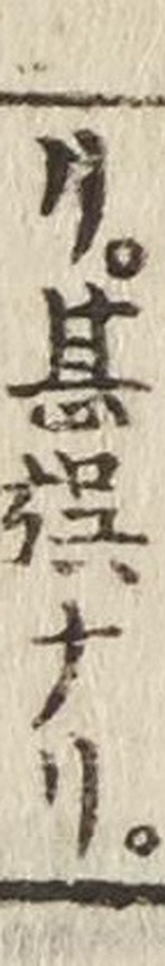リ。其誤ナリ。
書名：大略天学名目鈔　天經或問附録
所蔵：東京大学地震研究所図書室 Earthquake Research Institute Library, The University of Tokyo, JAPAN
